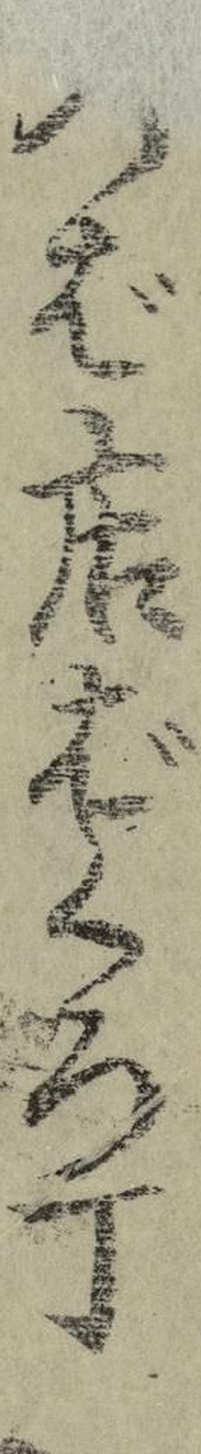つば店ばくろ丁
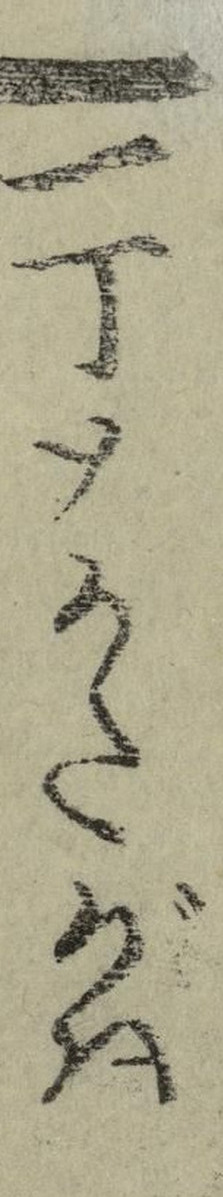一丁メかたがは
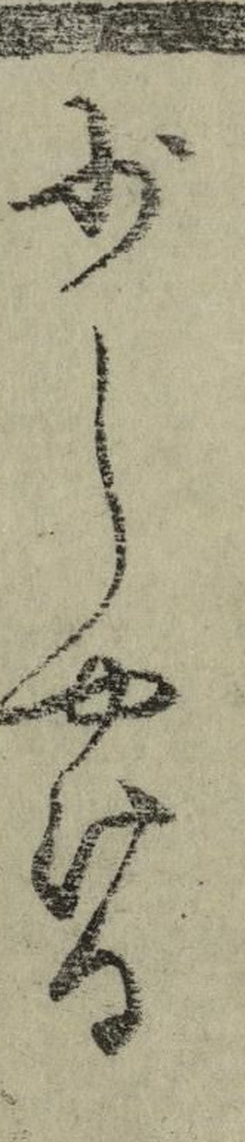少しやける
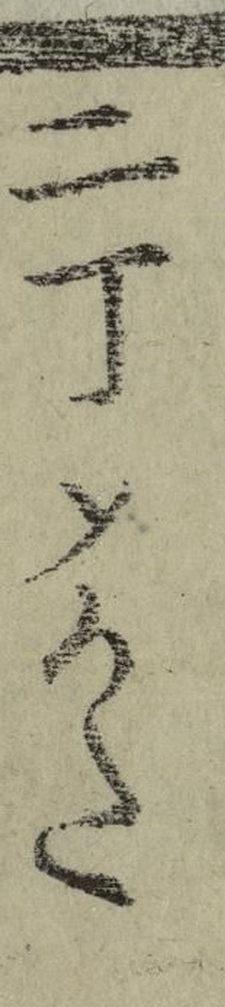二丁メかた
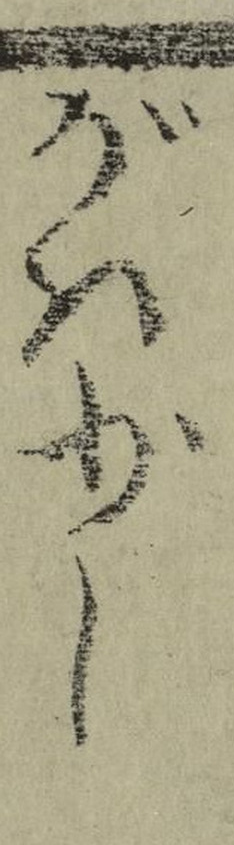がは少し
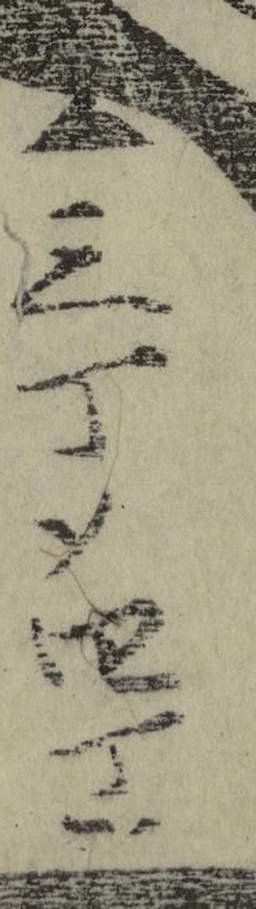▲三丁メ四丁メ
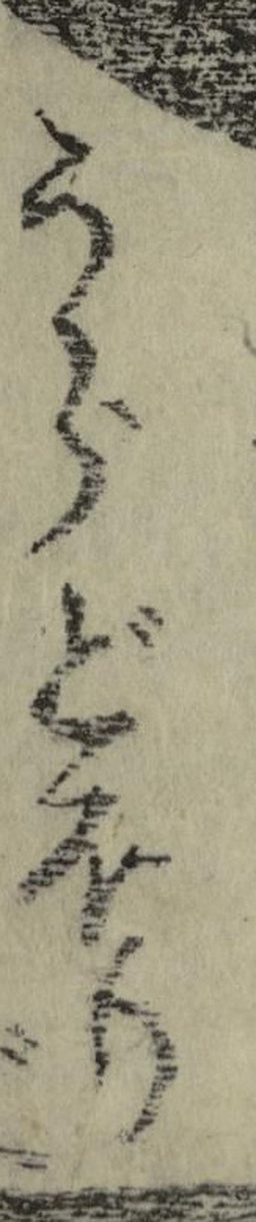うらどほり
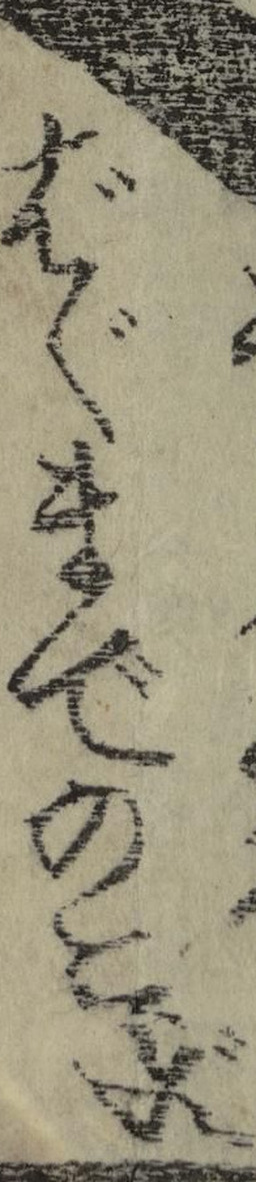ば〴〵までのこる
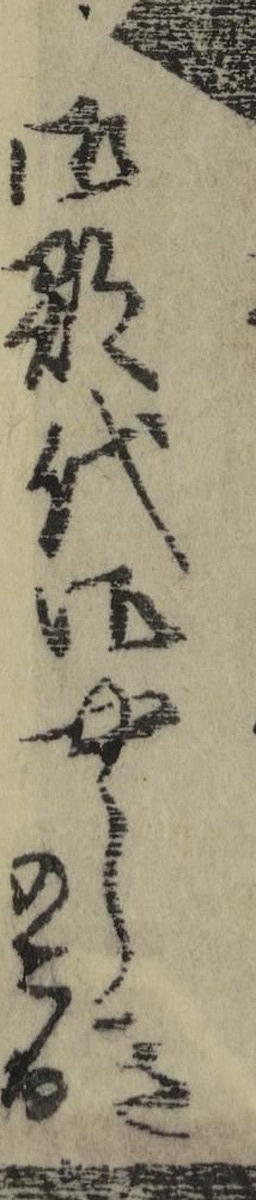御郡代御やしきのこる
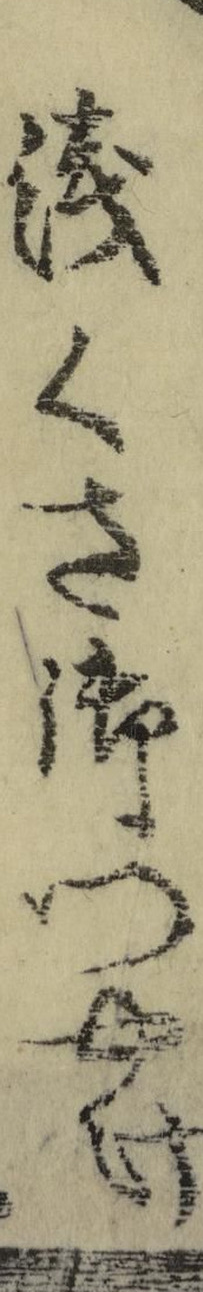浅くさ御門やけ
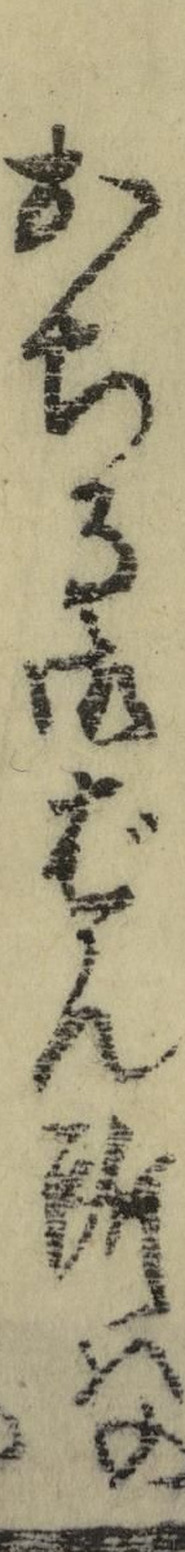おちる御ばん所はの
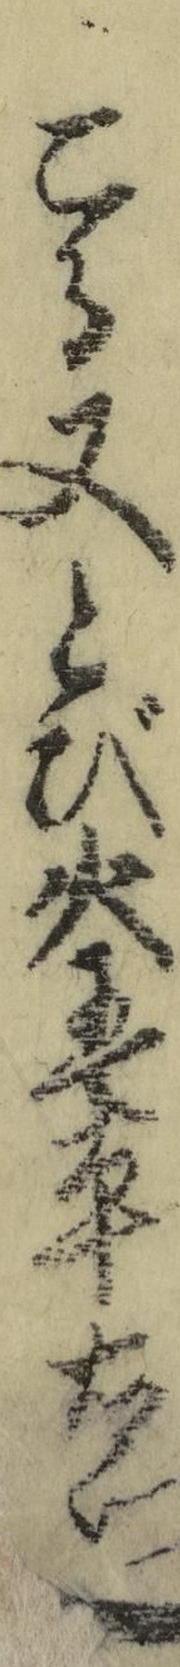こる又とび火にて平右衛門
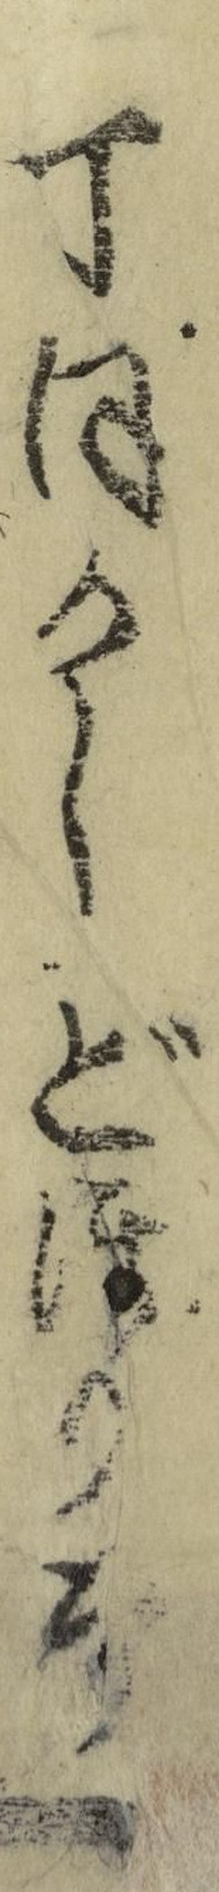丁同かしどほり第
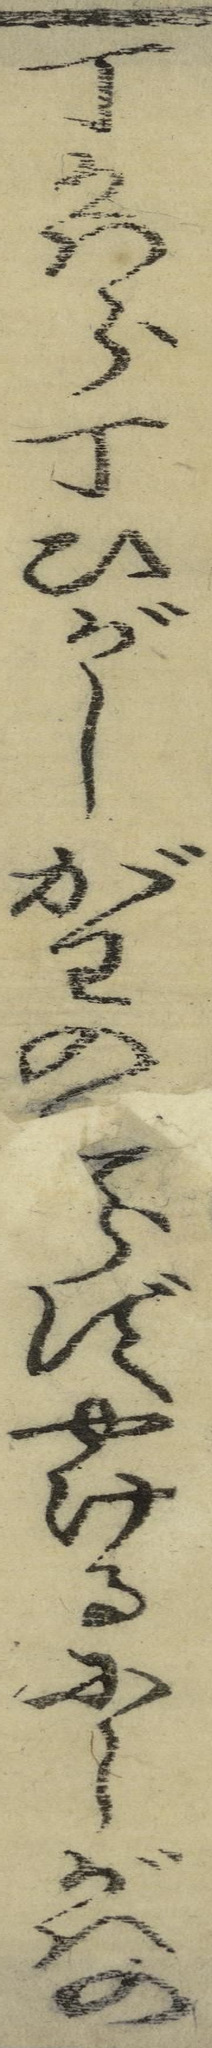丁かわら丁ひがしがわのこらずやけるにしがはの
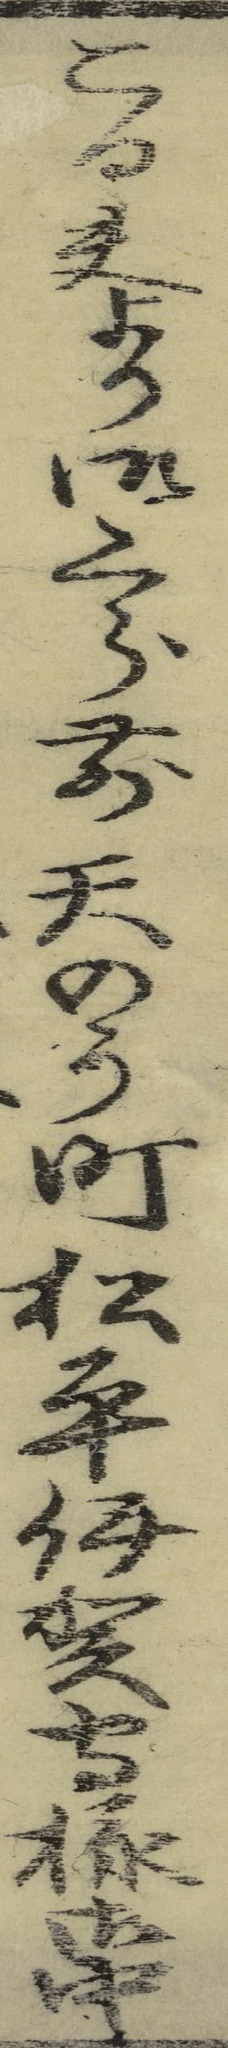こる夫より御くら前天のう町松平伊賀守様御中
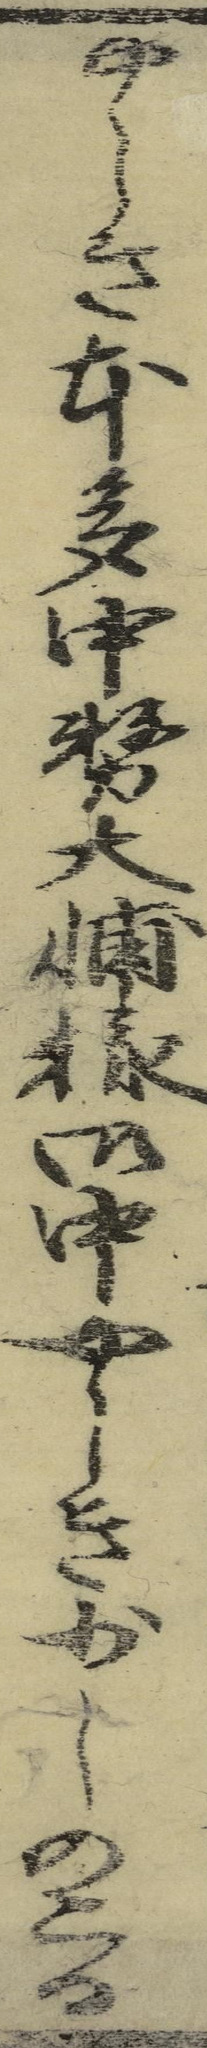やしき本多中務大輔様御中やしき少しのこる
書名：[安政二年三月の江戸大火に関する瓦版]
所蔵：東京大学地震研究所図書室 Earthquake Research Institute Library, The University of Tokyo, JAPAN
